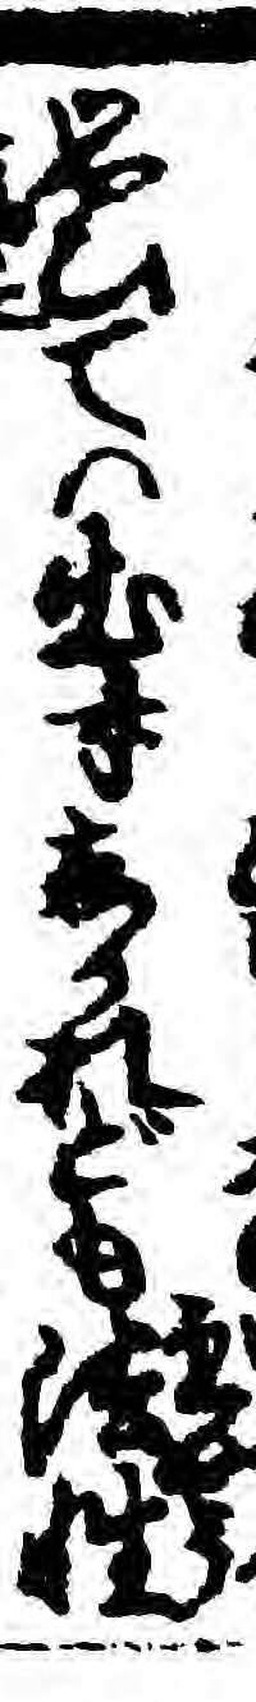思ひては出すしかれども法性
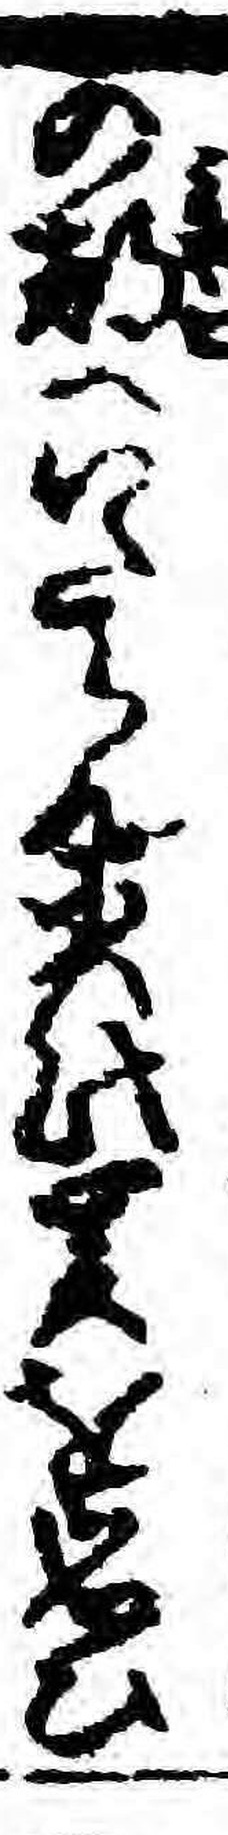の都へいたらんには此関を思ひ
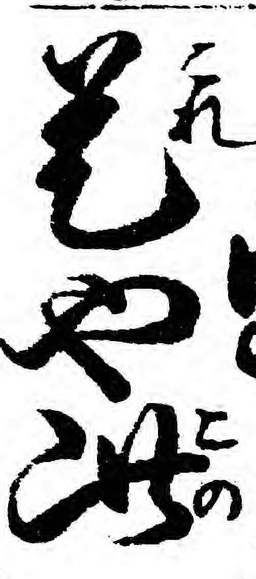是や此
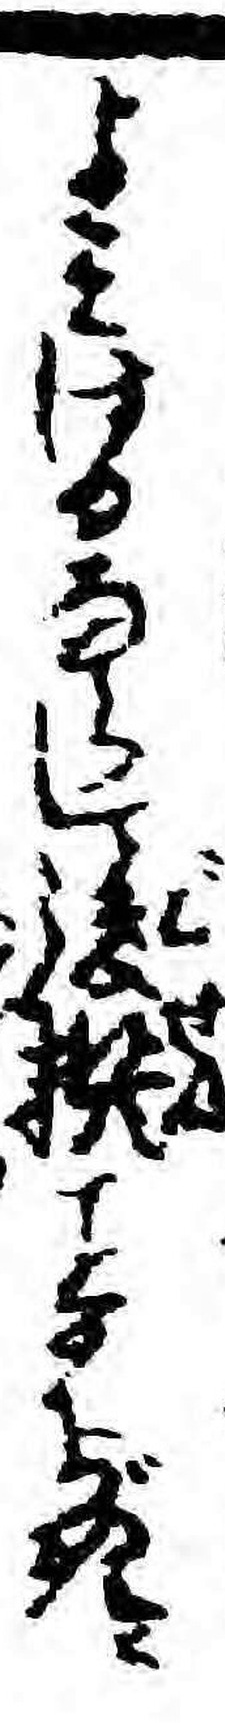よみけるならし後撰ことはがきに
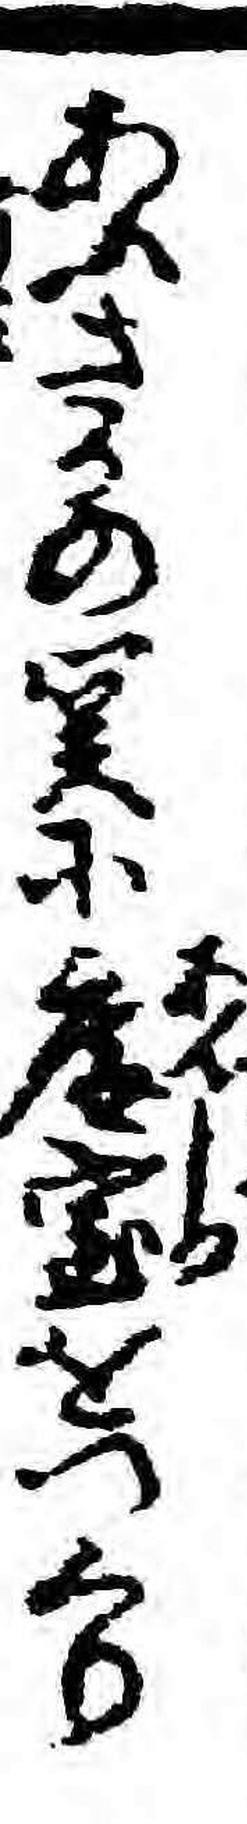あふさかの関に庵室をつくり
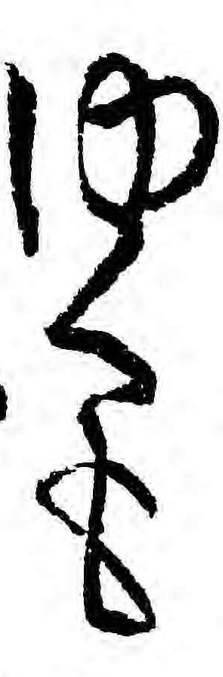ゆくも
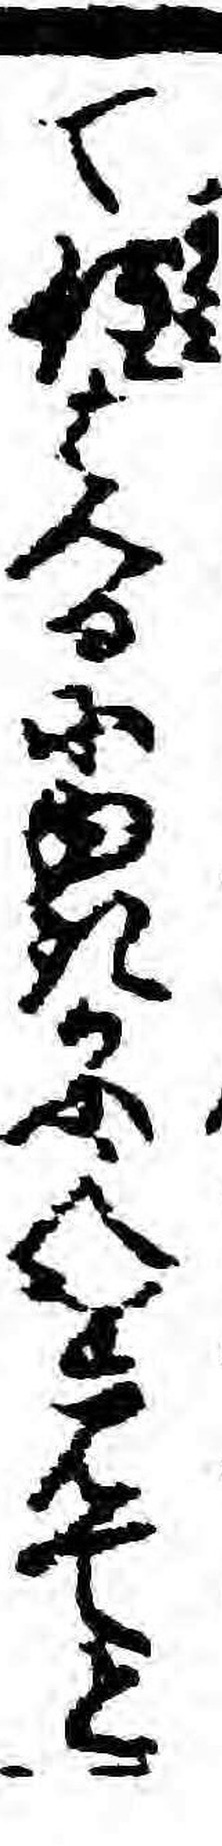て住はへるにゆきかふ人を見てと
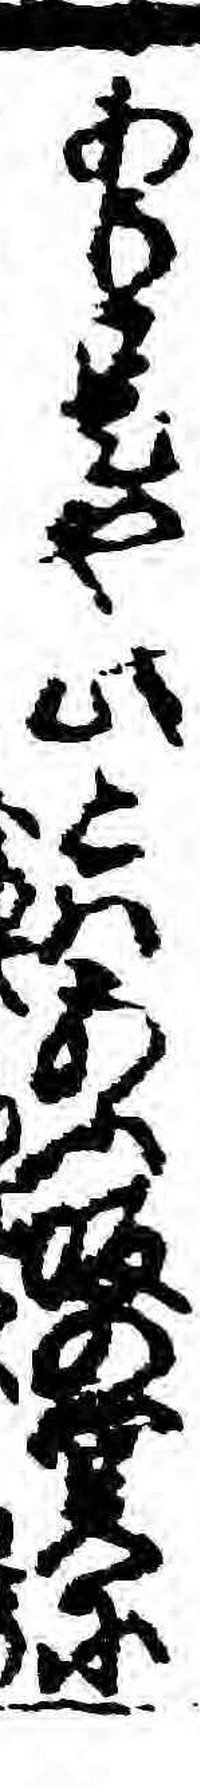あり是や此とはあふ坂の関に
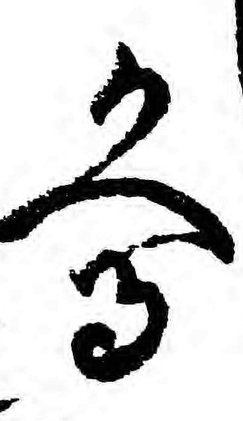かへる
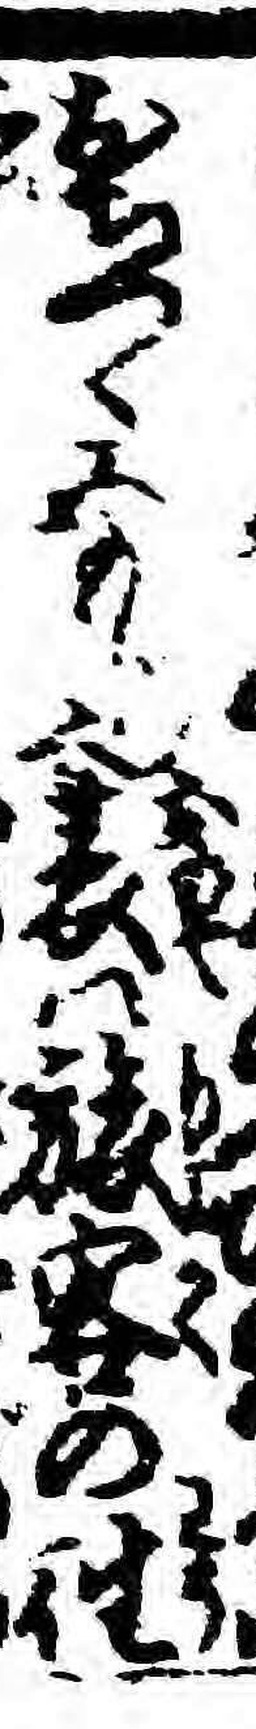おちつく五もじ也表は旅客の往
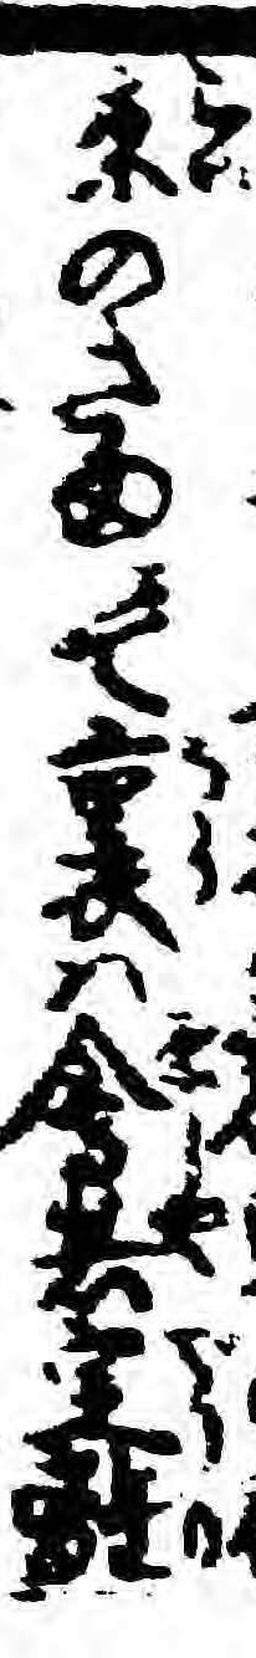来のさまにて裏は会者定離
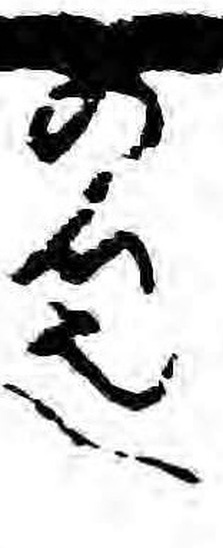の心也
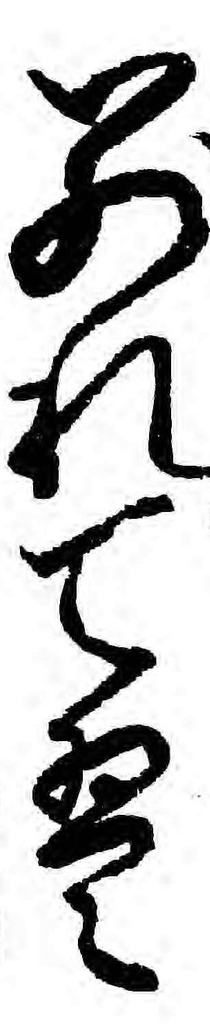別れては
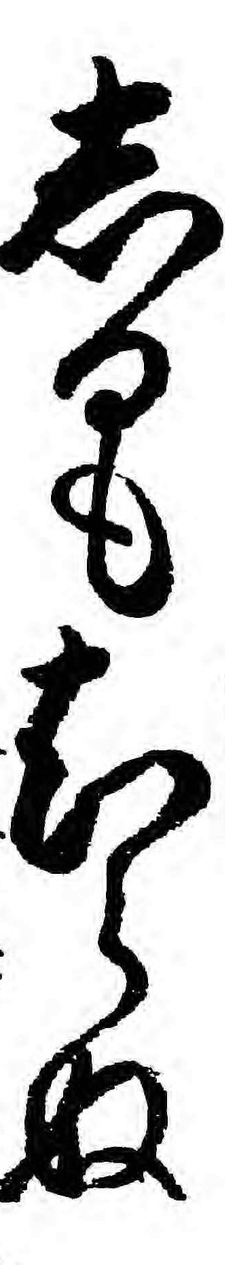しるも知らぬも
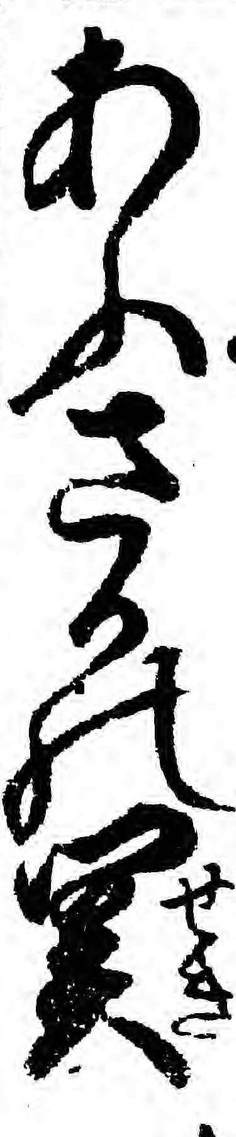あふさかの関
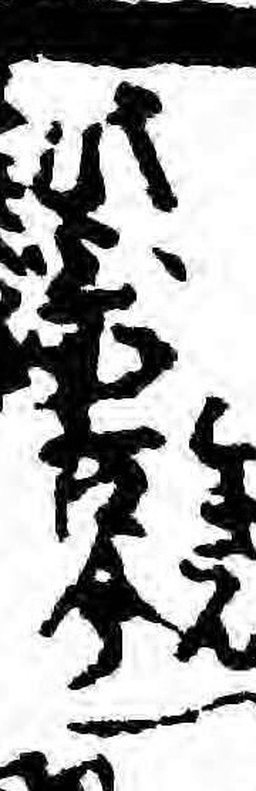此哥古今
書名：頭書和歌注譯／壽賀多百人一首小倉錦
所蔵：国文学研究資料館
